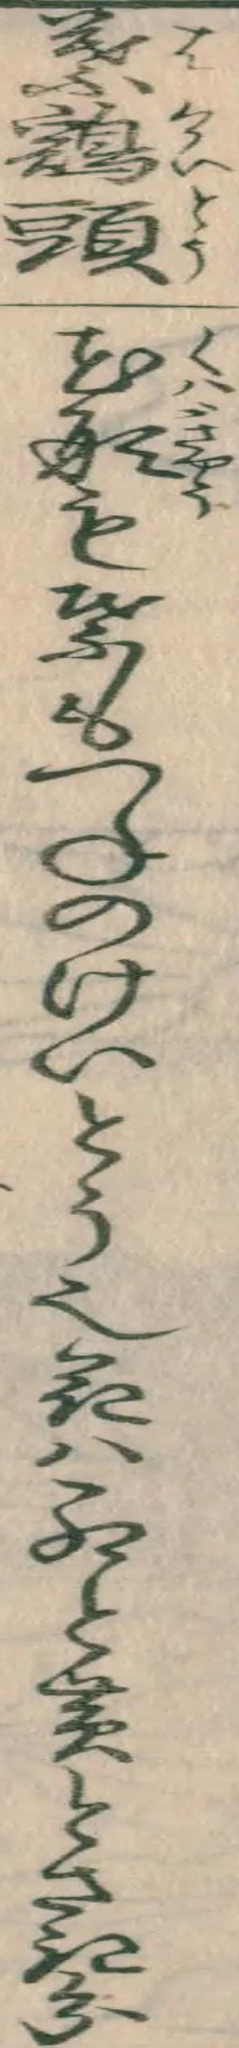[葉鶏頭]花形も葉もつねのけいとう也花は紅と黄とさき分
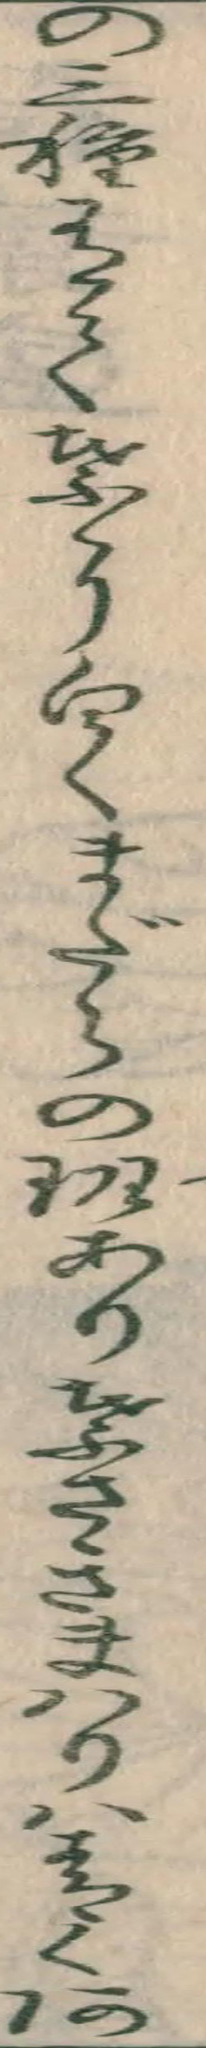の三種有て葉に白くまだらの班あり葉さきまはりは青くあ
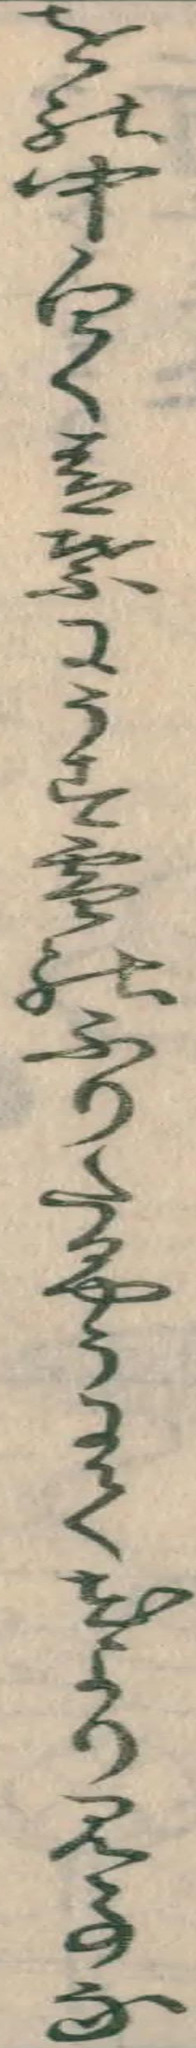をの中白く青紫にうす雪のふりたるやうにて花より見事な
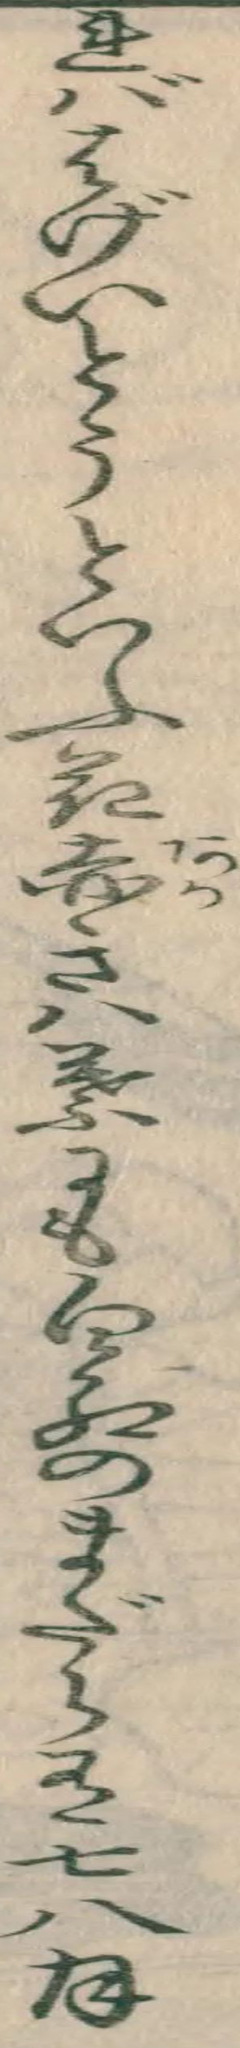ればはげいとうといふ花赤きは葉にも白紅のまだら有七八月
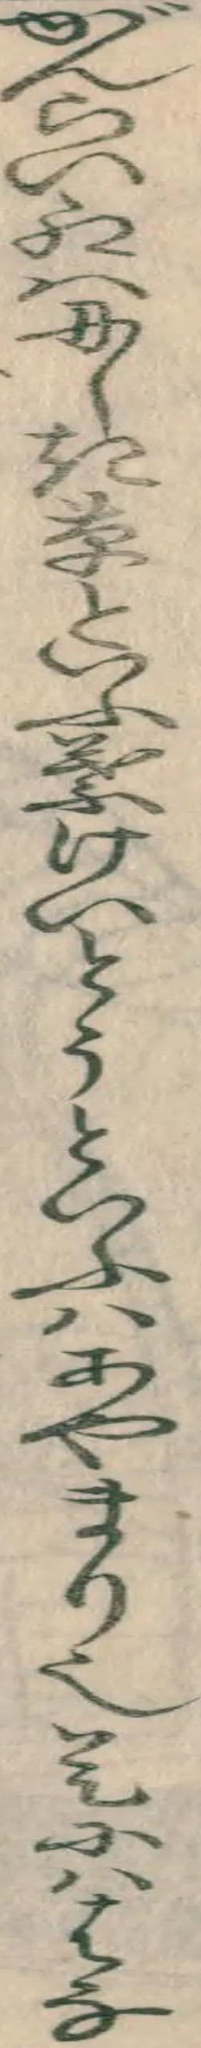がんらい紅はにしき草といふ葉けいとうといふはあやまり也是にははな
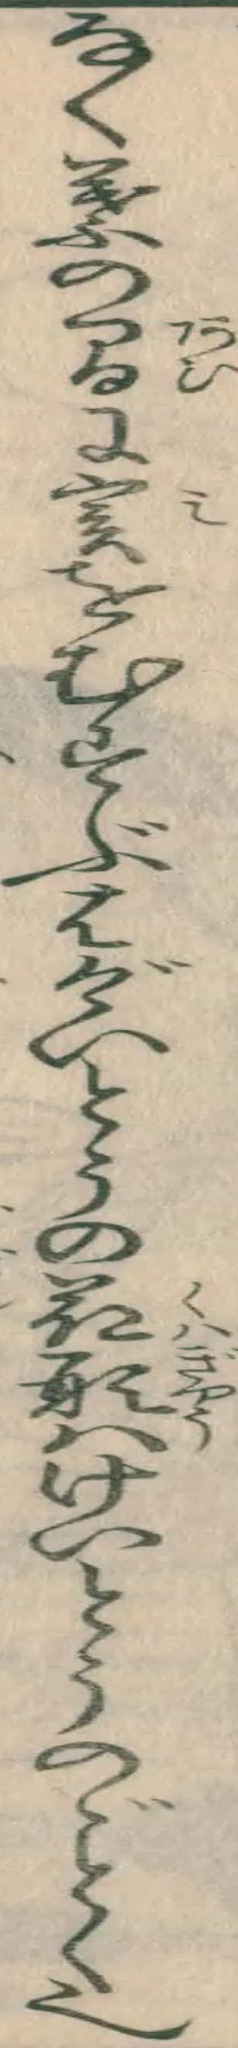なく葉の間に実をむすぶはげいとうの花形はけいとうのごとく也
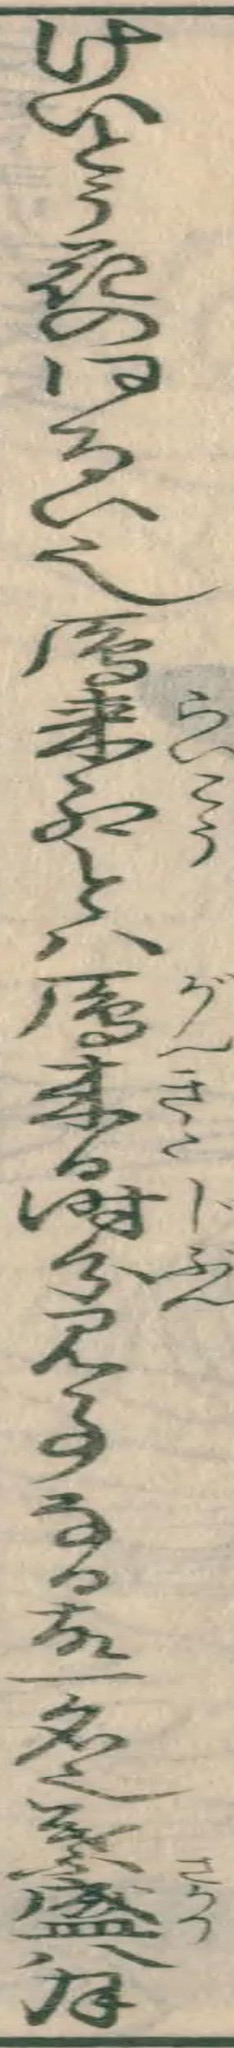けいとう花の同るい也鳫来紅とは鳫来る時分見事なる故一名也葉盛八月
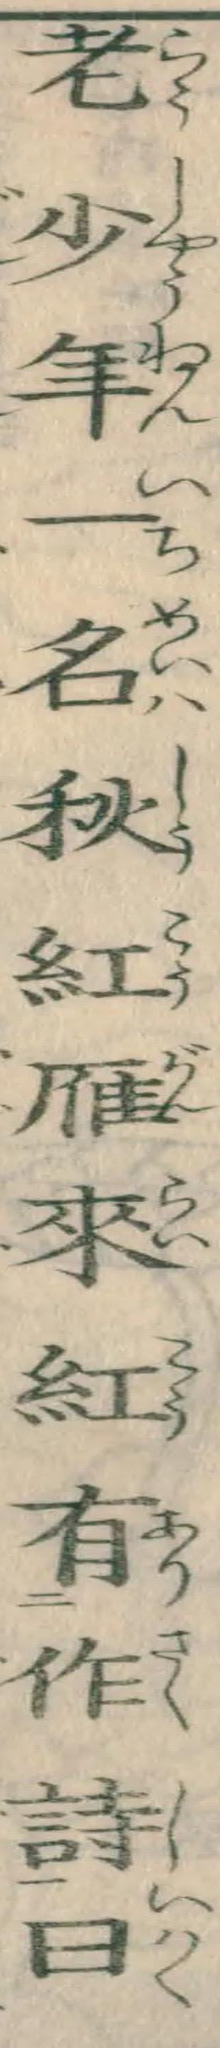老少年一名秋紅雁来紅有作詩曰
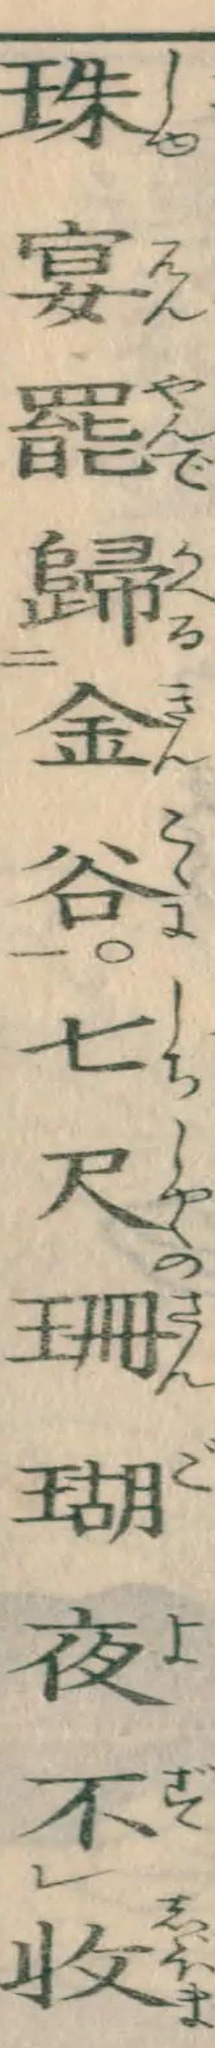珠宴罷帰金谷。七尺珊瑚夜不収

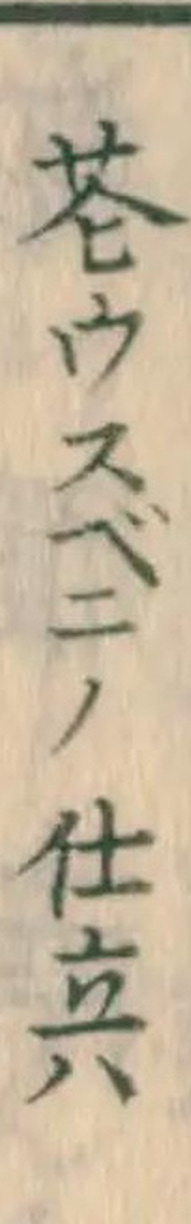花ウスベニノ仕立ハ
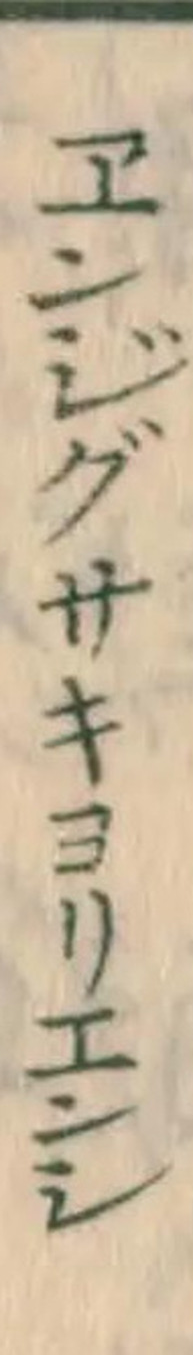ヱンジグサキヨリエンシ
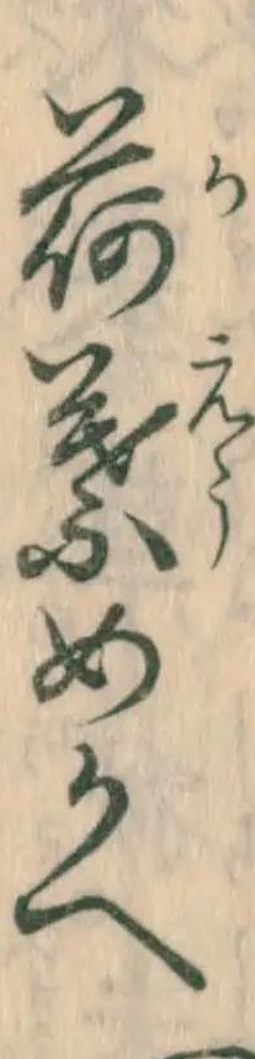荷葉めかへ
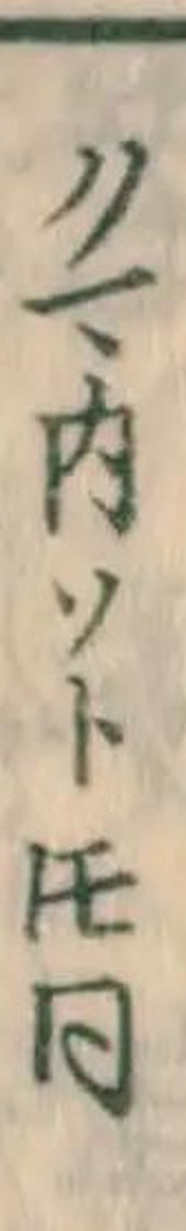クマ内ソト𪜈同
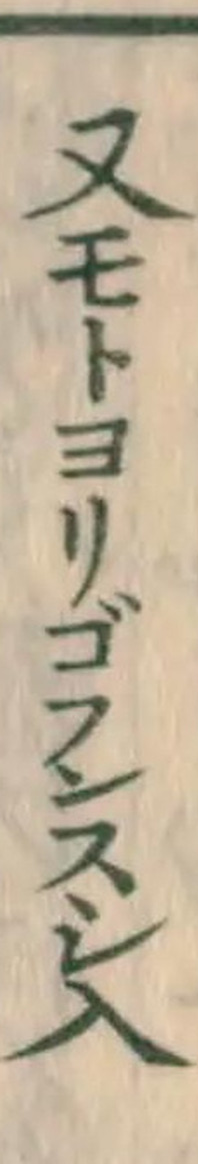又モトヨリゴフンスシ入
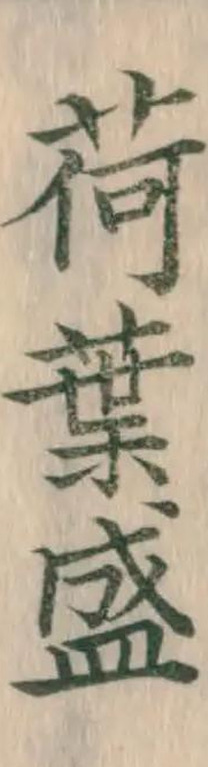荷葉盛
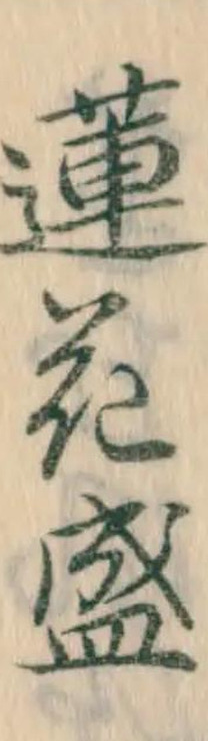蓮花盛
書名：畫本野山草. [5]
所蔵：国立国会図書館 National Diet Library, JAPAN
